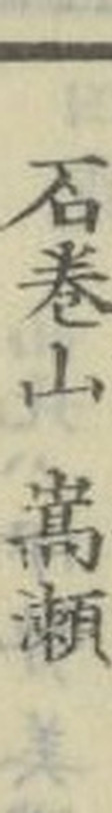石巻山嵩瀬
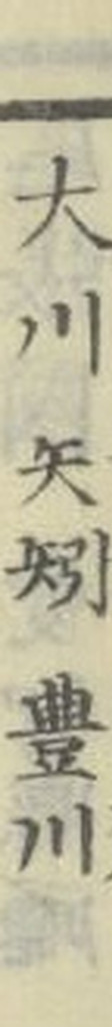大川矢矧豊川
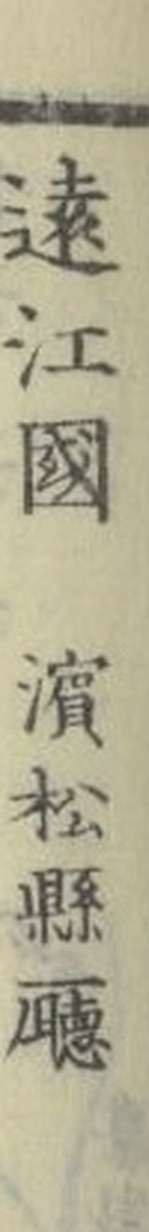遠江國濵松縣廰
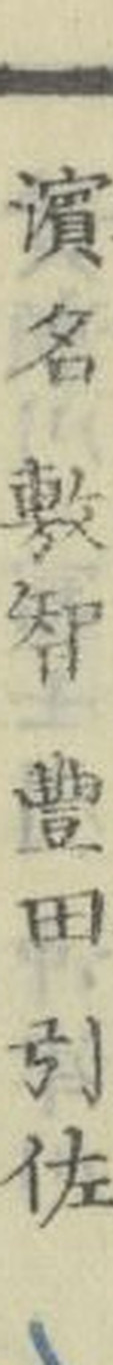濵名敷智豊田引佐
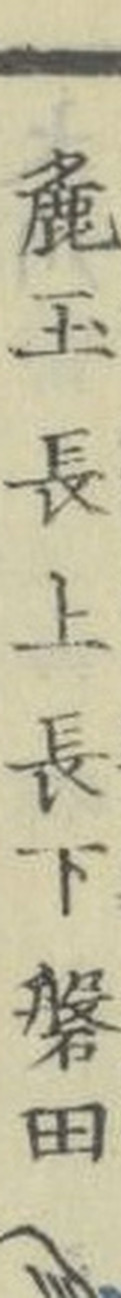麁玉長上長下磐田
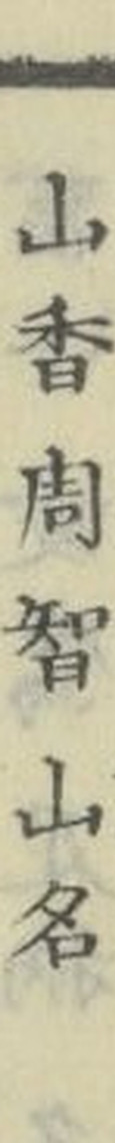山香周智山名
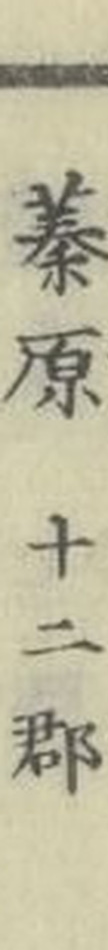蓁原十二郡
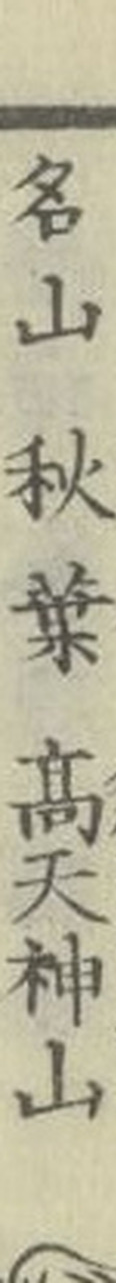名山秋葉髙天神山
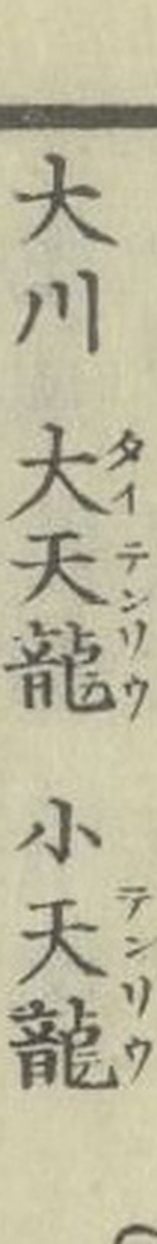大川大天龍小天龍
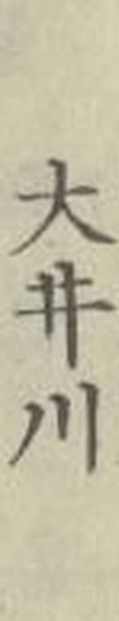大井川

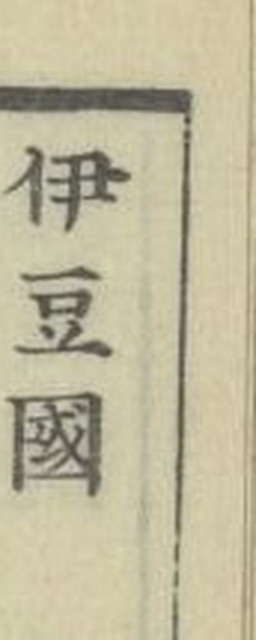伊豆國
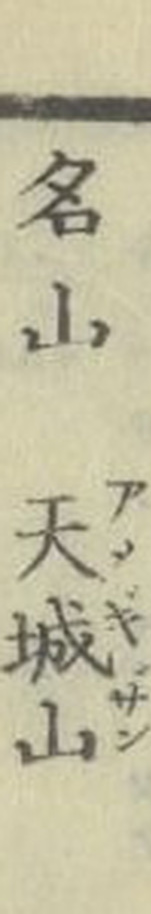名山天城山
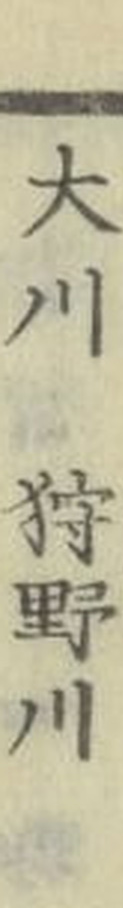大川狩野川
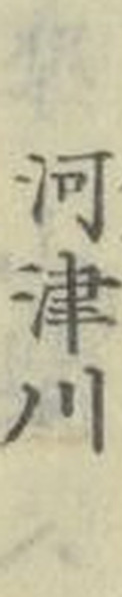河津川
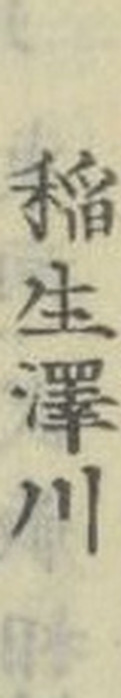稲生澤川
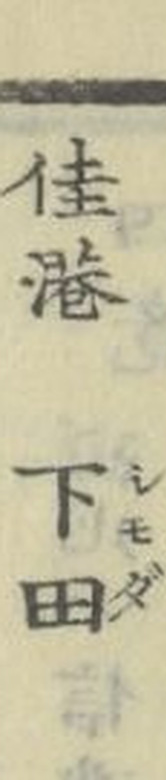佳港下田
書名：下等小学日本地誌略図問答 巻上 畿内東海道之部
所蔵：University of the Ryukyus Library
